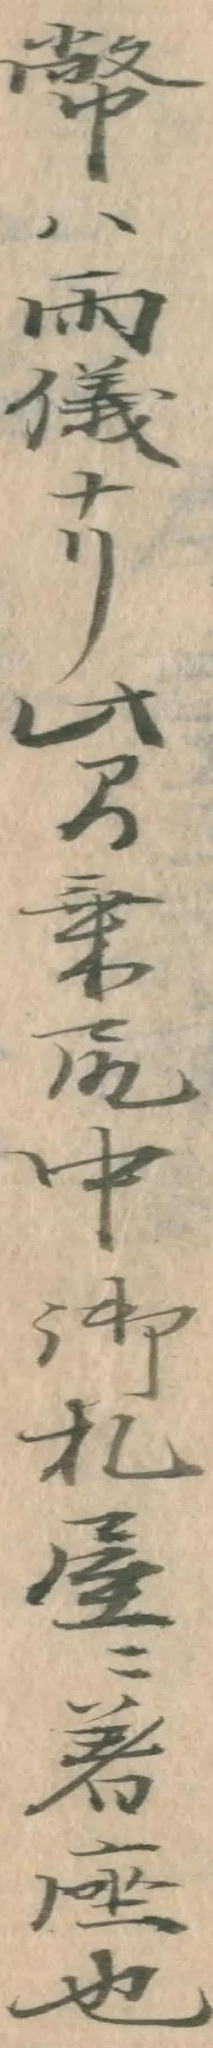幣ハ雨儀ナリ此間乗尻中御札屋ニ着座也
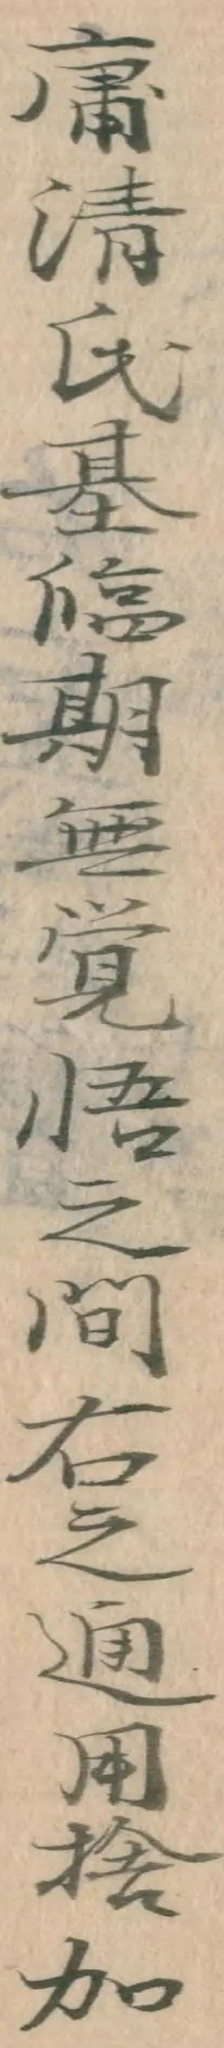庸清氏基臨期無覚悟之間右之通用捨加
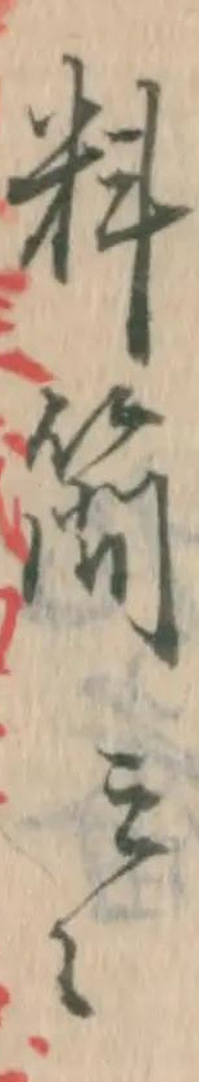料簡云々
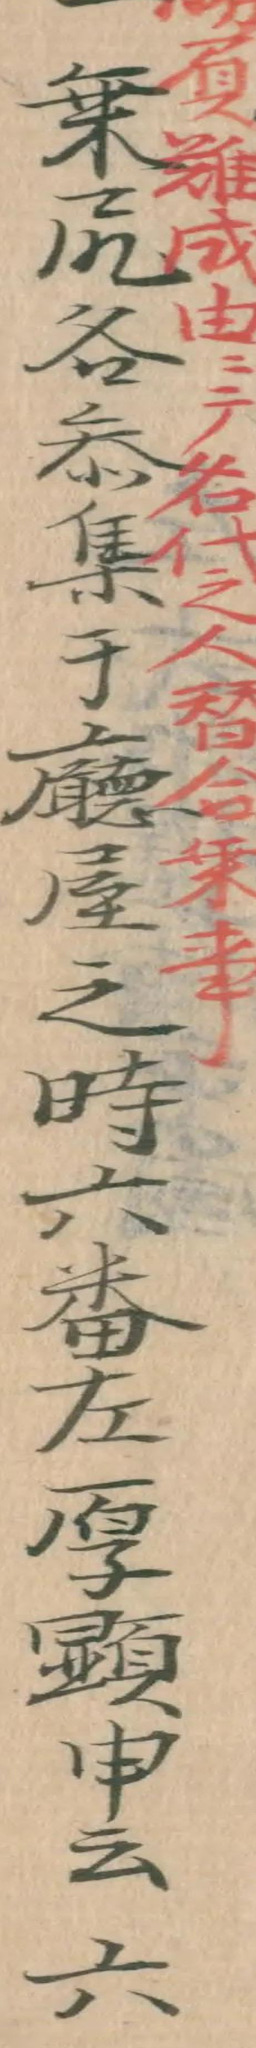一乗尻各参集于庁屋之時六番左厚顕申云六
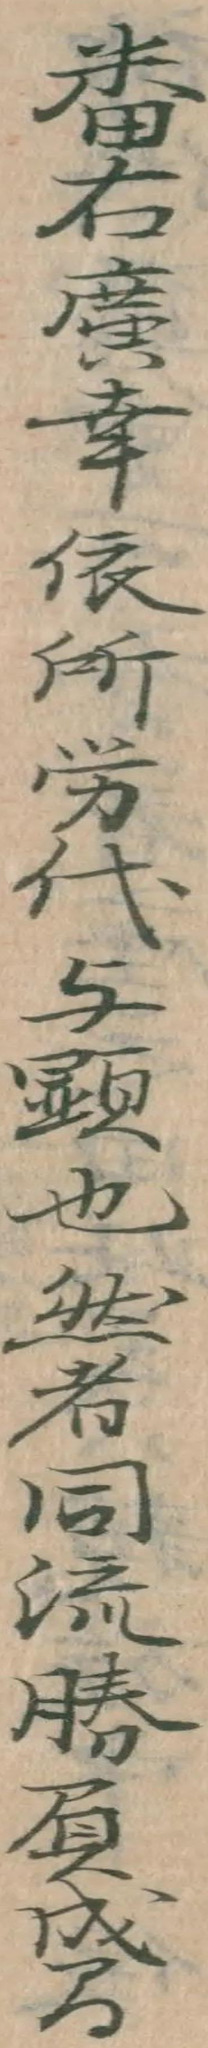番右広幸依所労代与顕也然者同流勝負成間
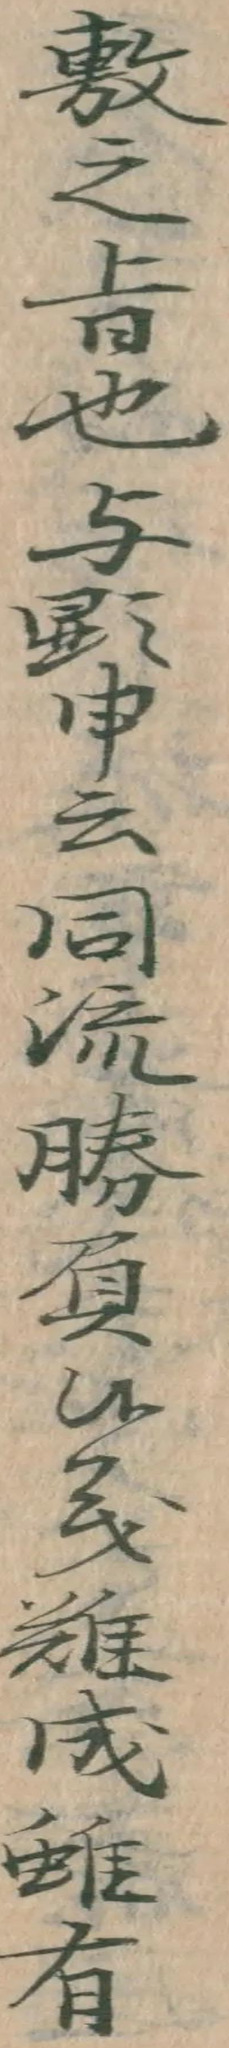敷之旨也与顕申云同流勝負候義難成雖有
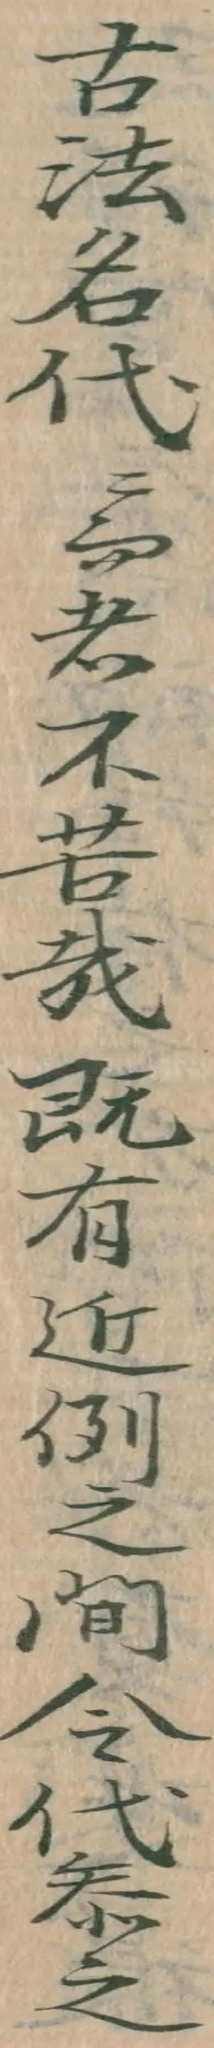古法名代ニ而者不苦哉既有近例之間令代参之
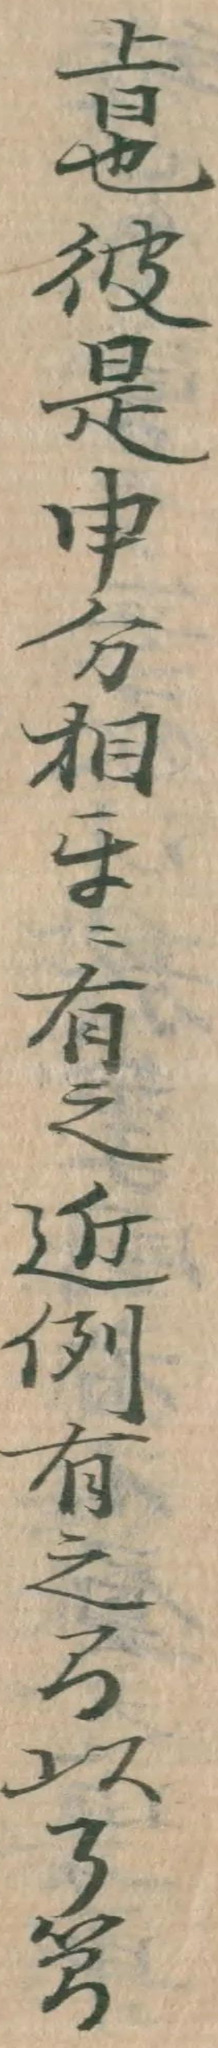旨也彼是申分相互ニ有之近例有之間以了簡
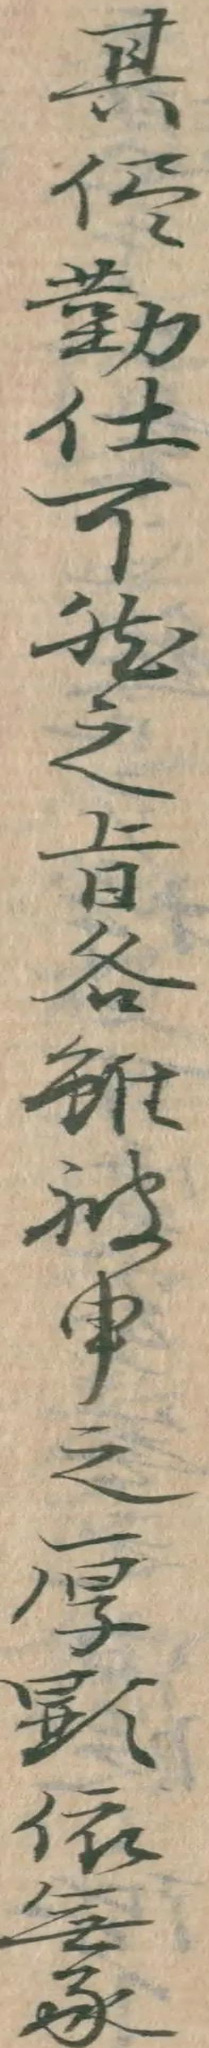其侭勤仕可然之旨各雖被申之厚顕依無承
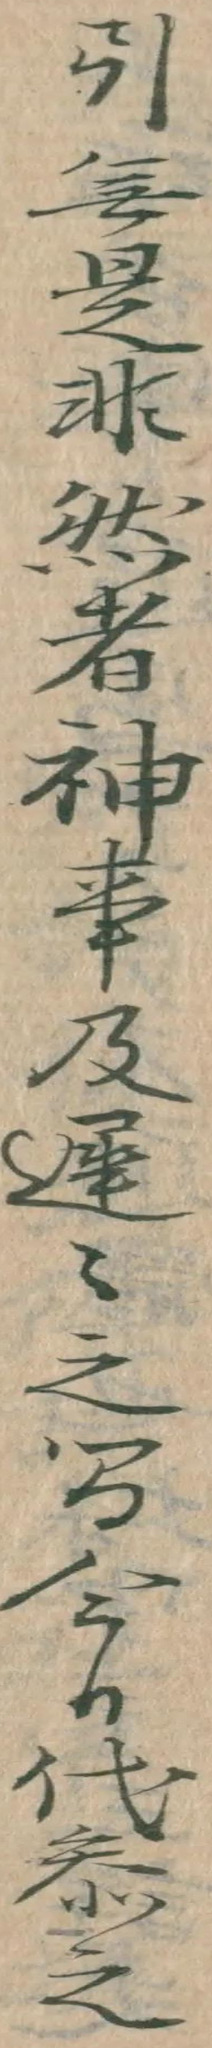引無是非然者神事及遅々之間今日代参之
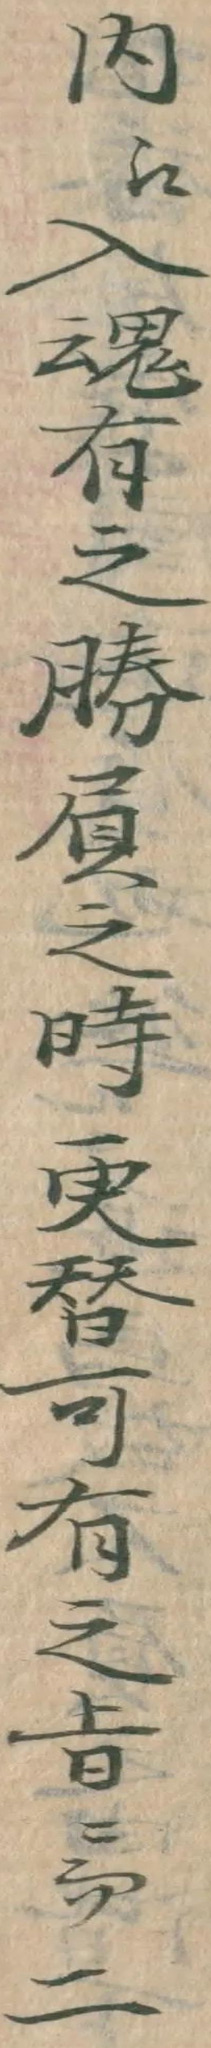内江入魂有之勝負之時更替可有之旨ニ而二
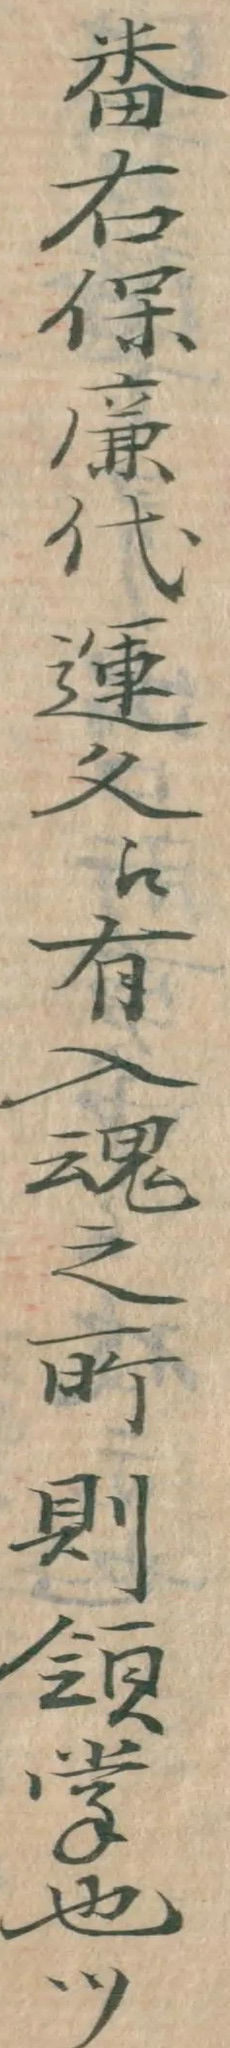番右保廉代運久江有入魂之所則領掌也ツ
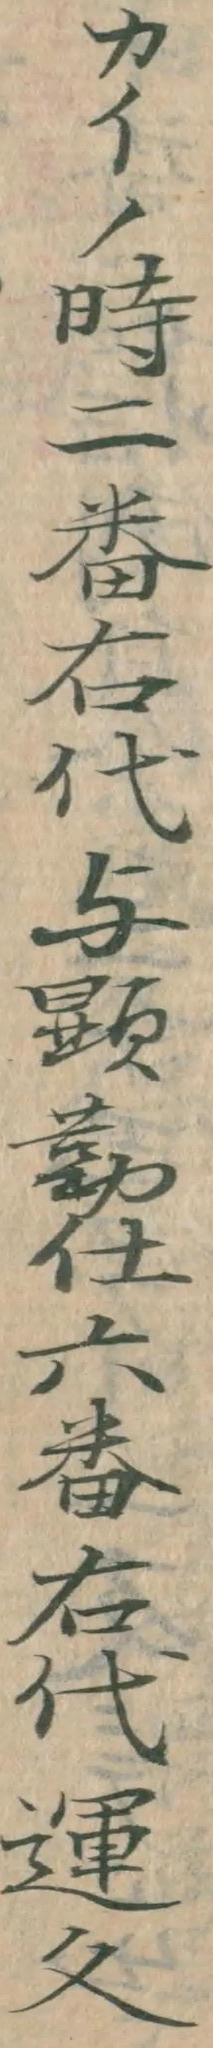カイノ時二番右代与顕勤仕六番右代運久
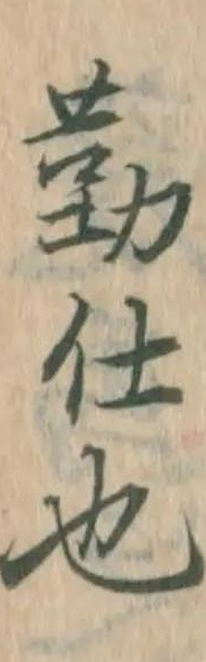勤仕也

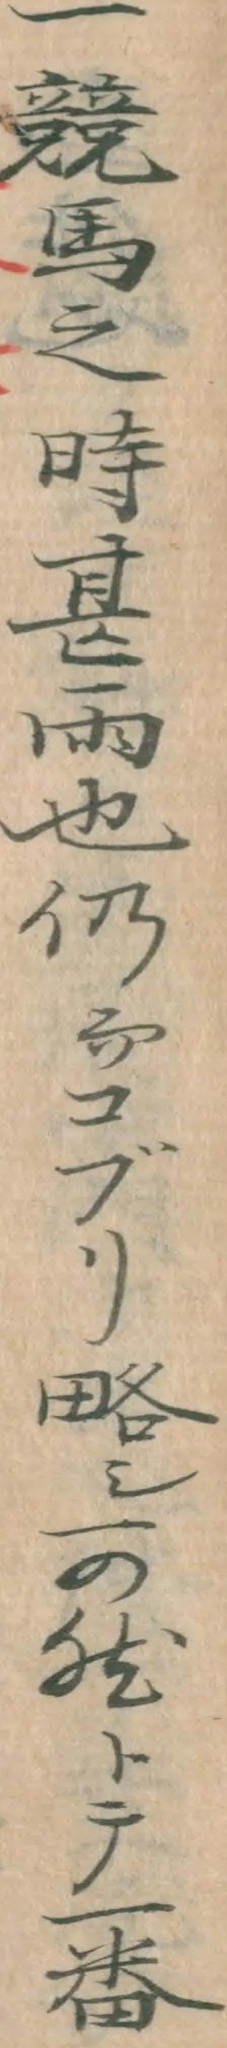一競馬之時甚雨也仍而コブリ略シ可然トテ一番
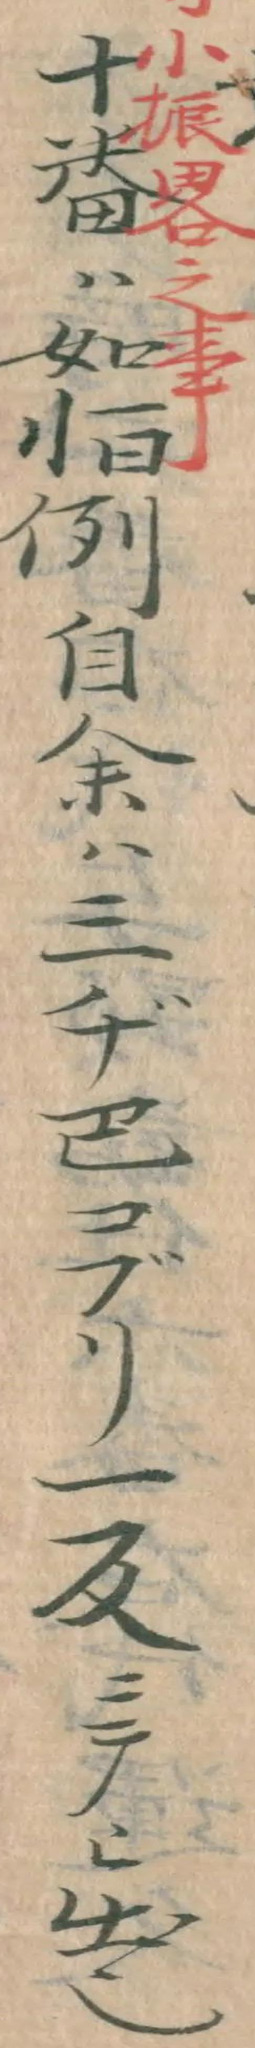十番ハ如恒例自余ハ三ヂ巴コブリ一反ニテ被出也
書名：賀茂社記録. 第10冊
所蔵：国立国会図書館 National Diet Library, JAPAN
